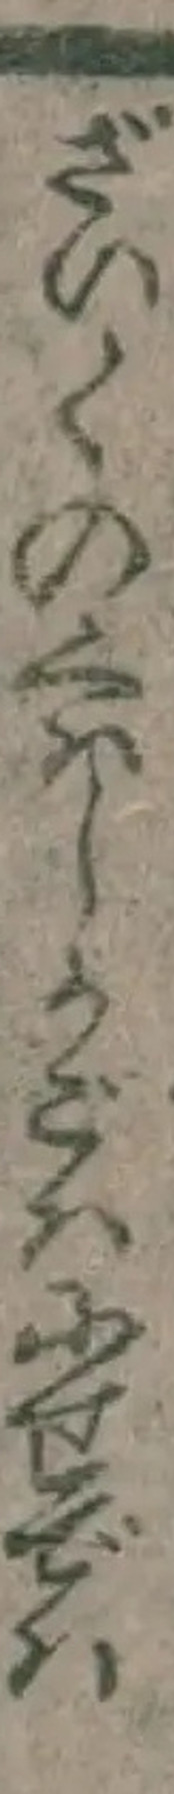ざいくのくはしかごはにせでは
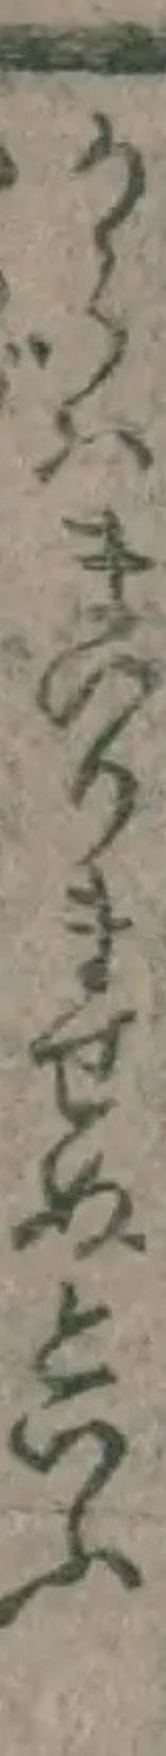からはまいりませぬといふ
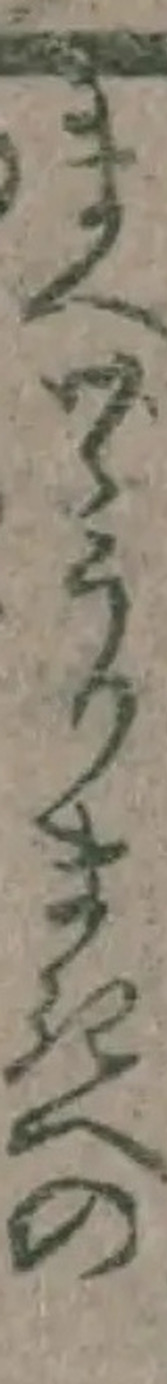まへづゝうりまきへの
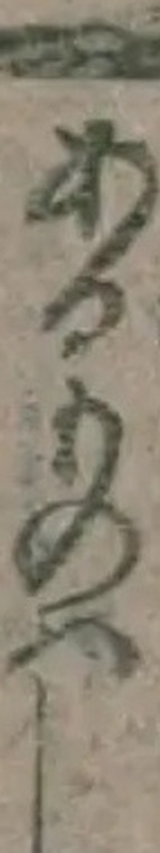あるものは
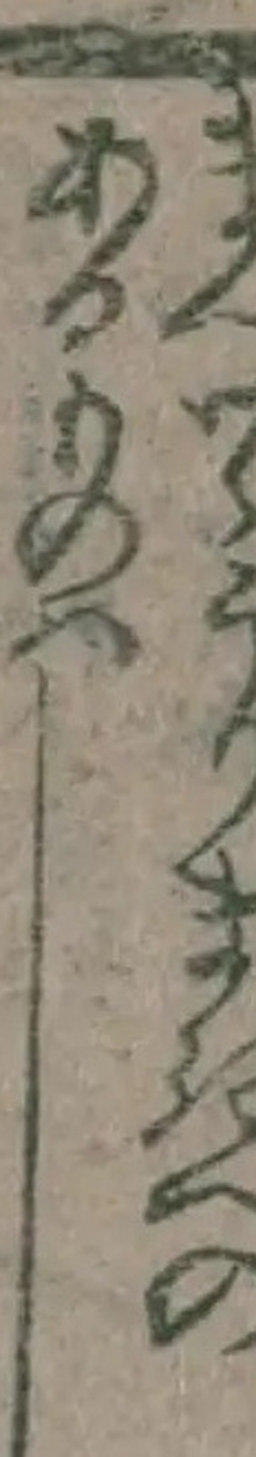あるものは
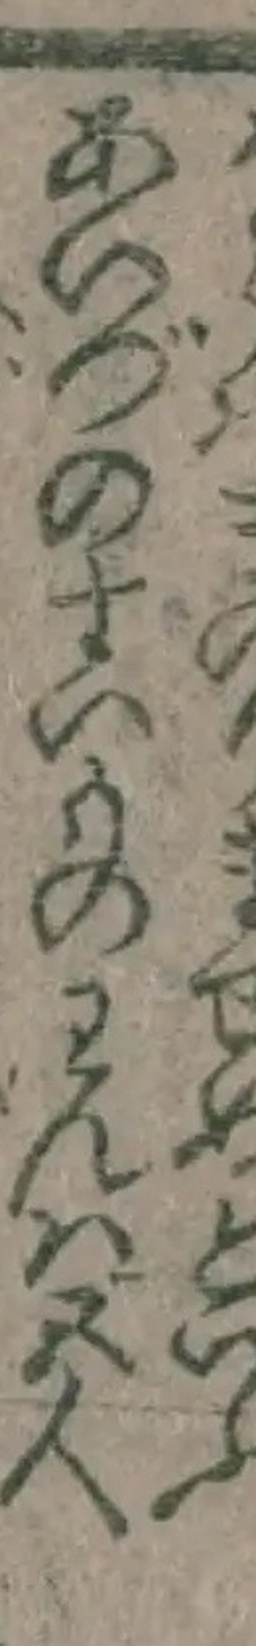あいづのすいものわんは五人
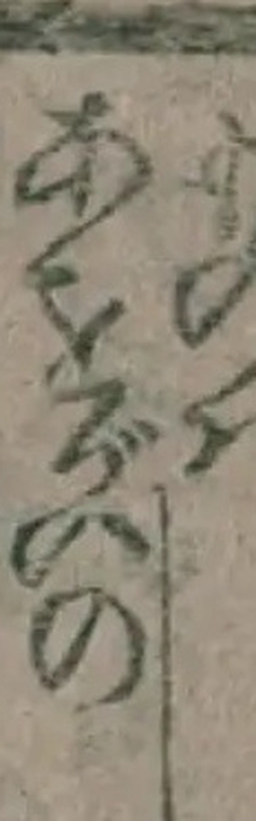あをがいの
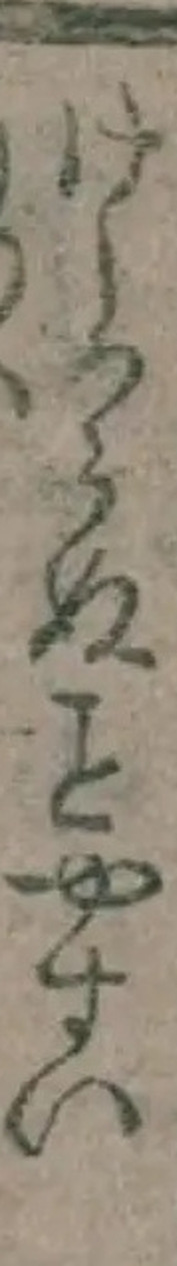けしからぬことやすい
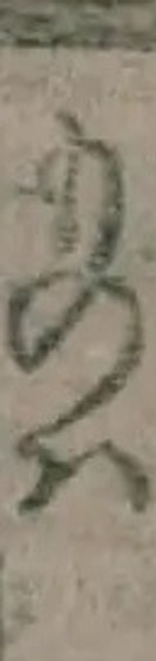ものは
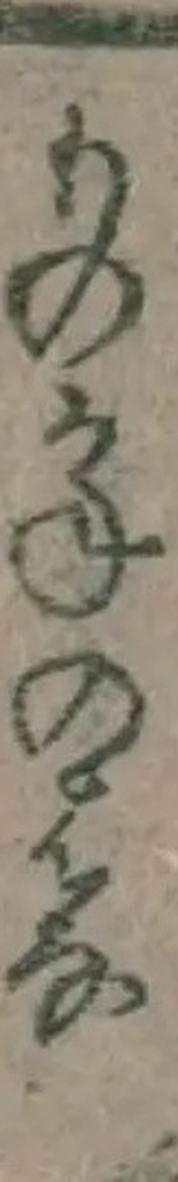ものかねのはな
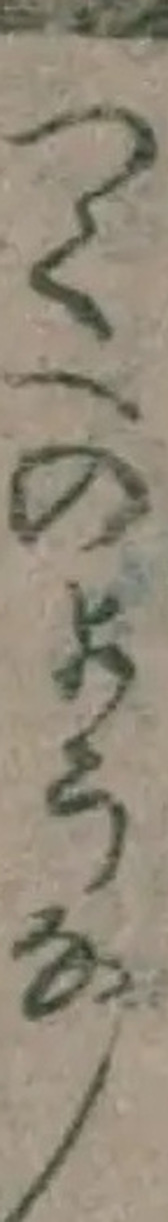つくへのような
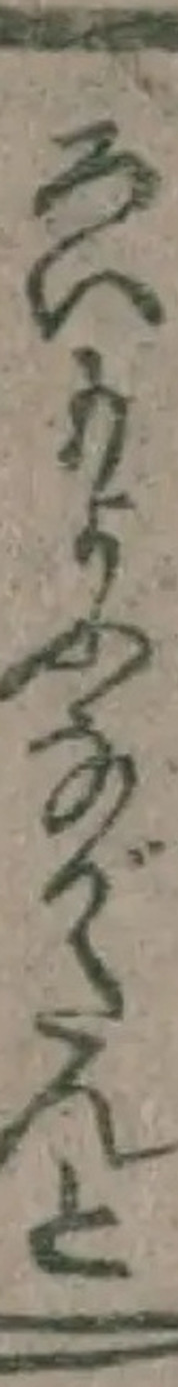ろいもよふながたんと
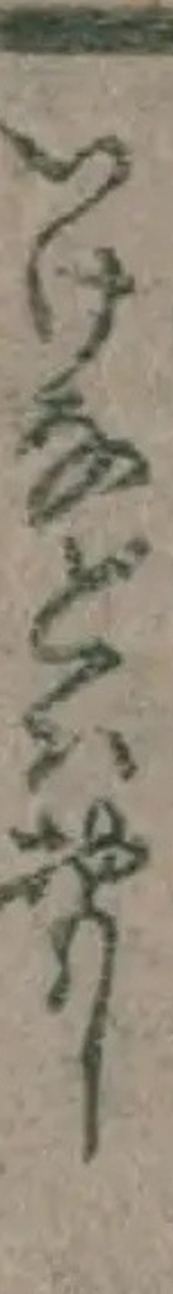いけなどはおもし
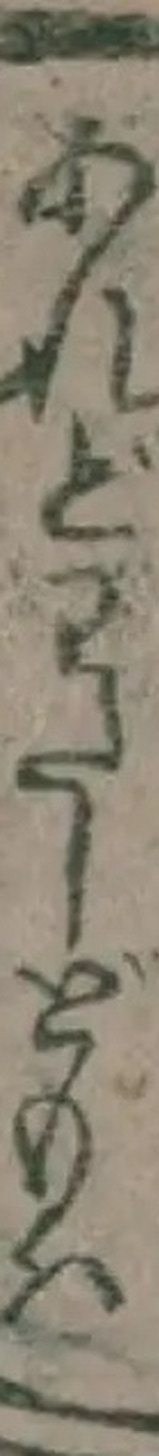あれどわたしどものは
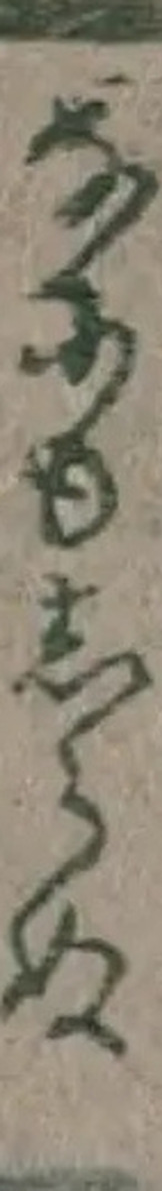なにもしらぬ
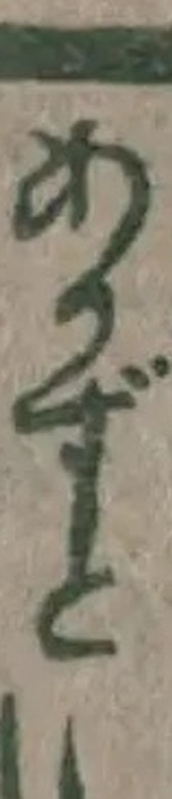あかずと
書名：縦筒放唐の噺 3巻
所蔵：国立国会図書館 National Diet Library, JAPAN
